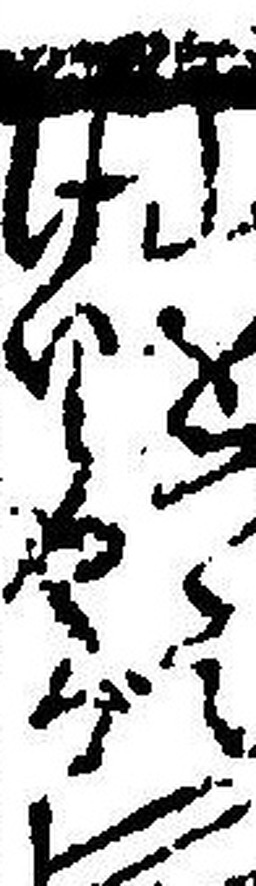けいしやが
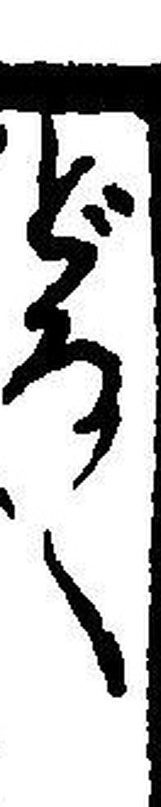どろ〳〵
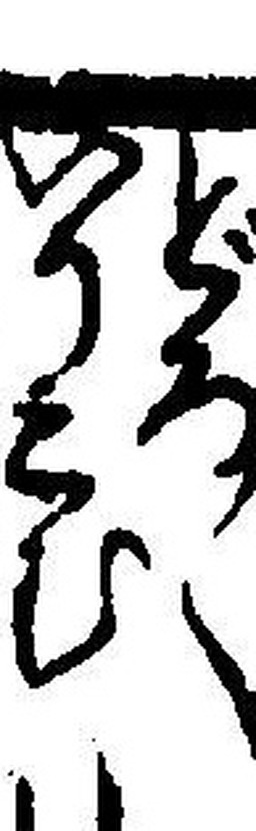いりこむ
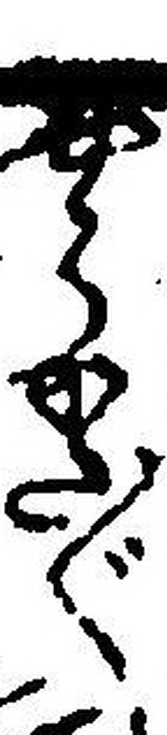やらかた〴〵
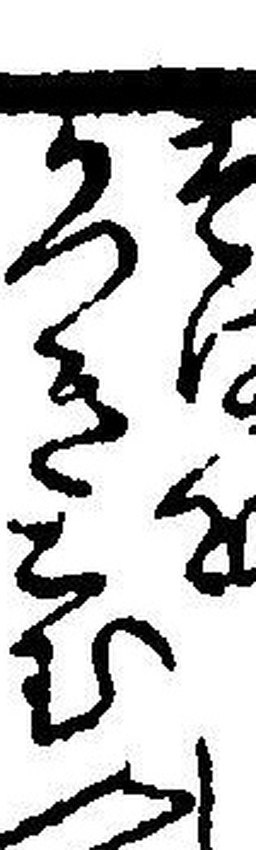かつきこむ
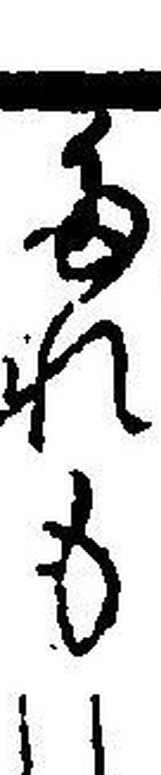たれも
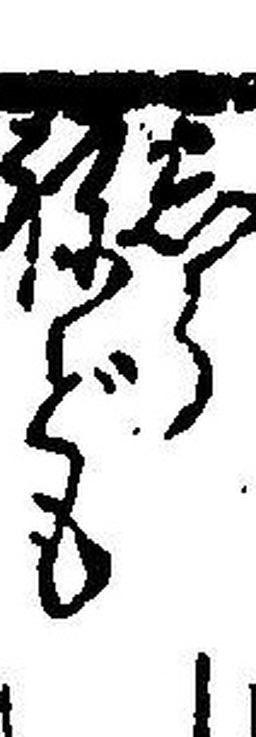ねども
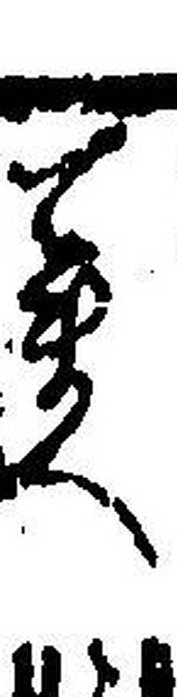てまへ
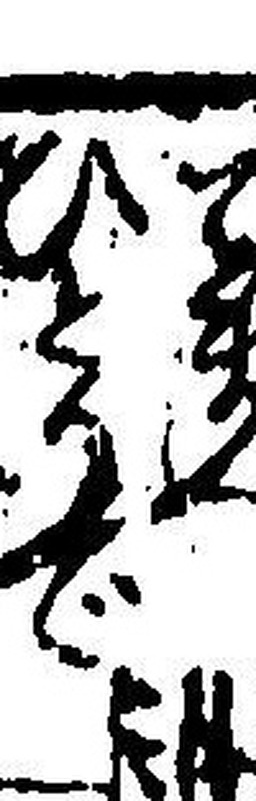ひとりで
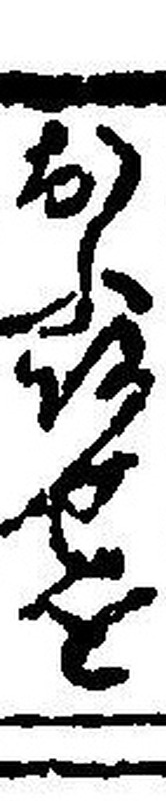おふあせを
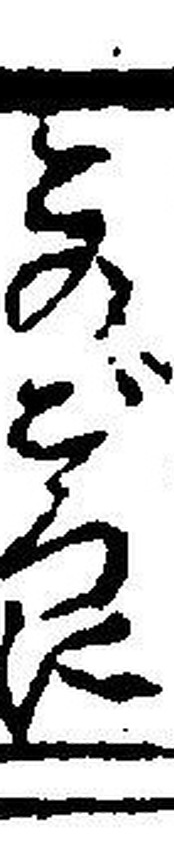このごろに
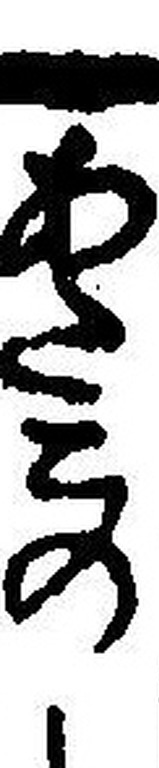あたこの
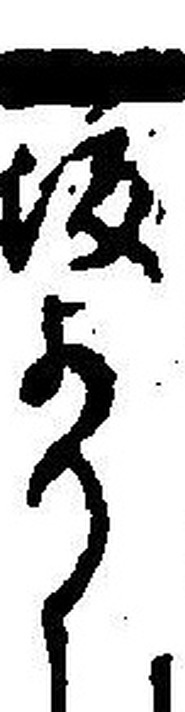坂より
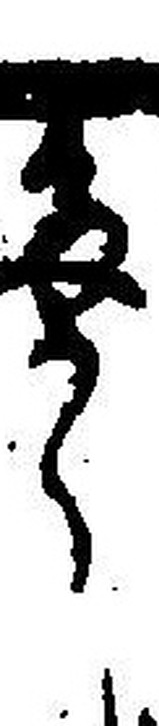たかく
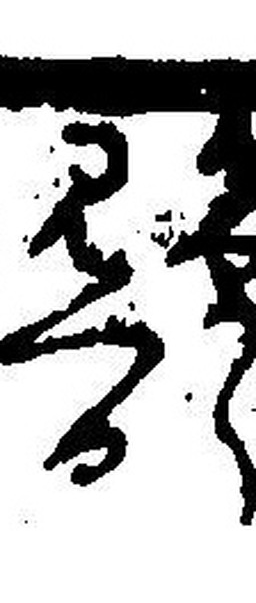見へる
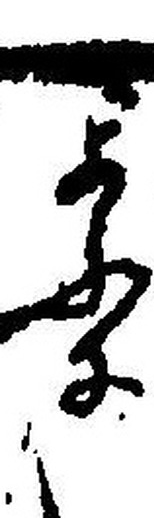よふに
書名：間違狐之女郎買 / 市場通笑作
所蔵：東京大学総合図書館 General Library in the University of Tokyo, JAPAN
